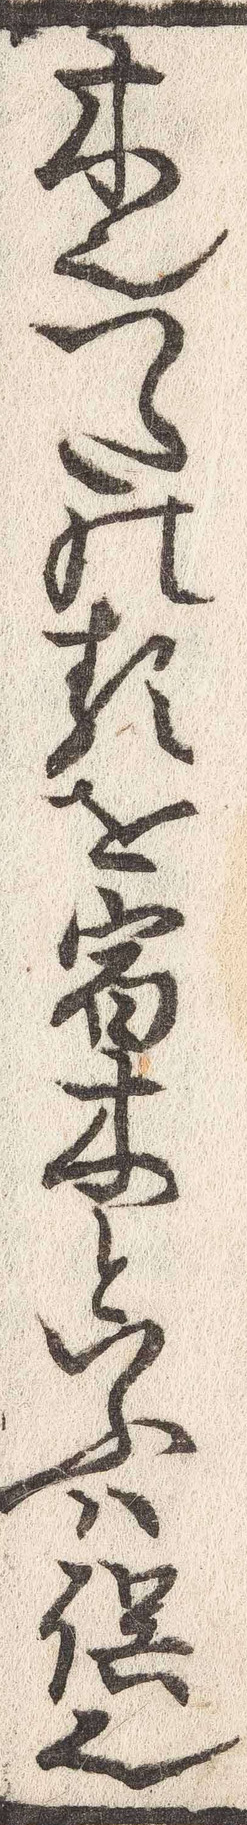木也つたの類を宿木といふは誤也
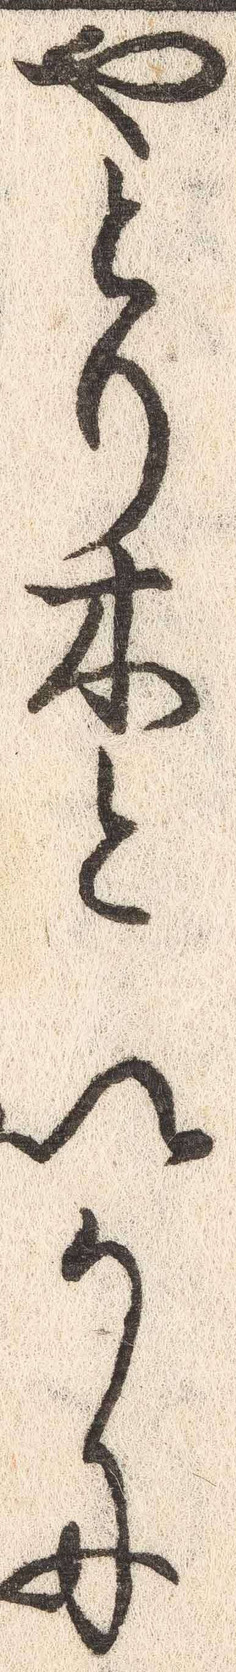やとり木といかに
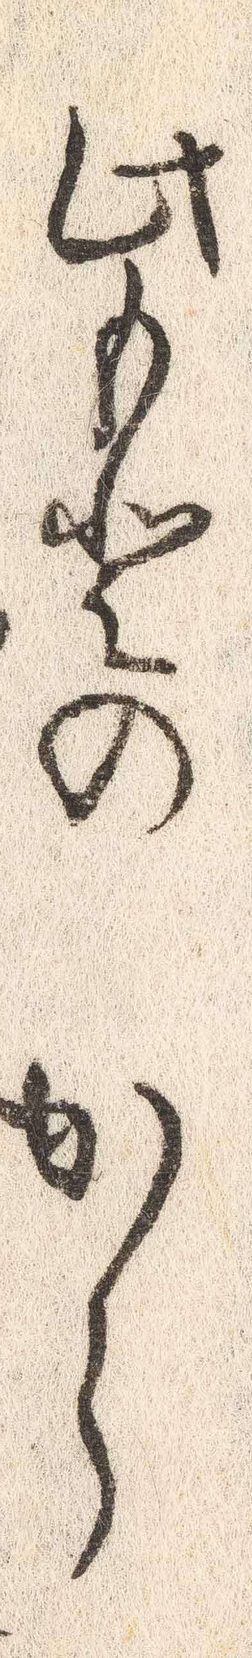此もとのから
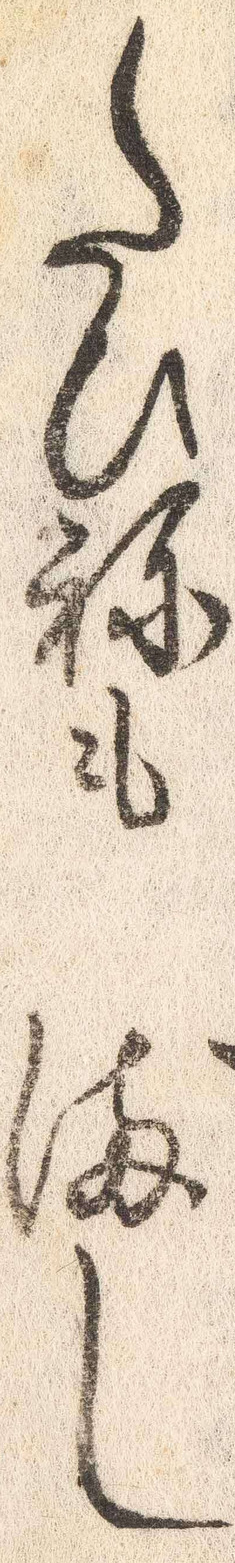たひねもまし

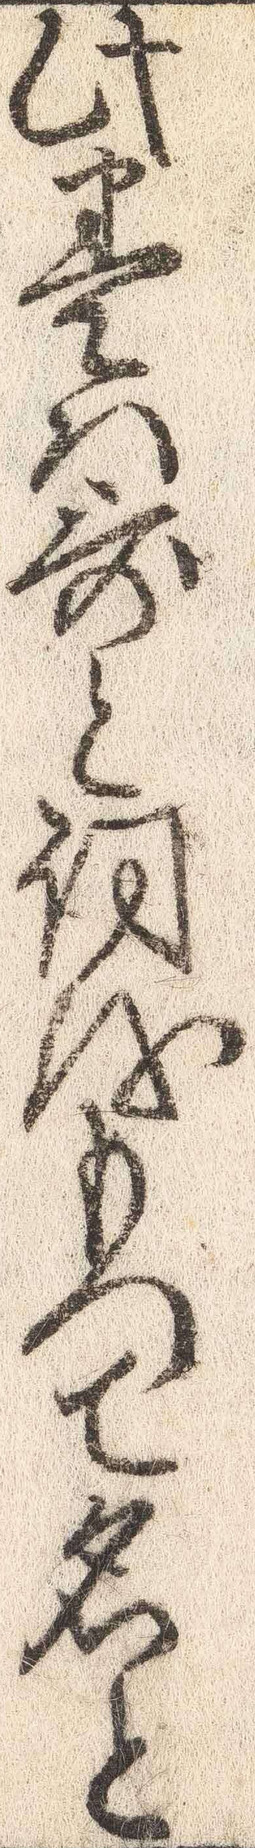此巻は哥と詞をもつて名と
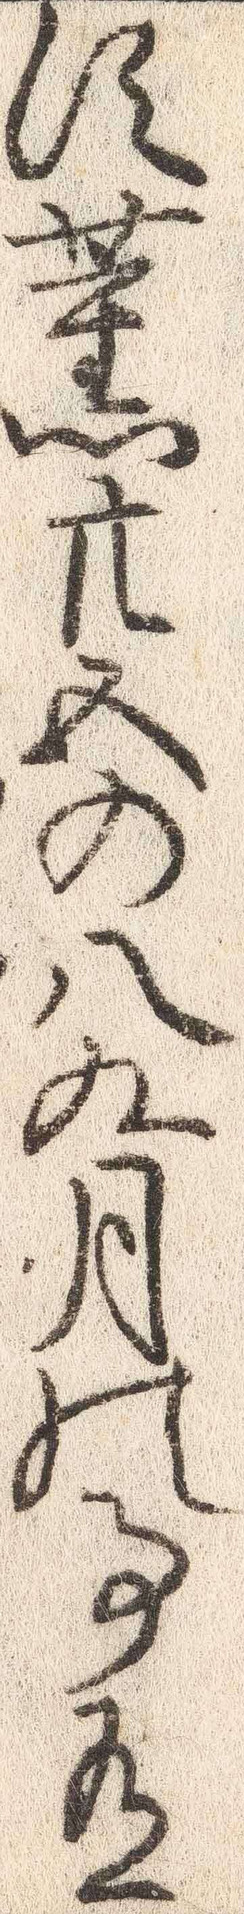す薫廿五の八九月の事有
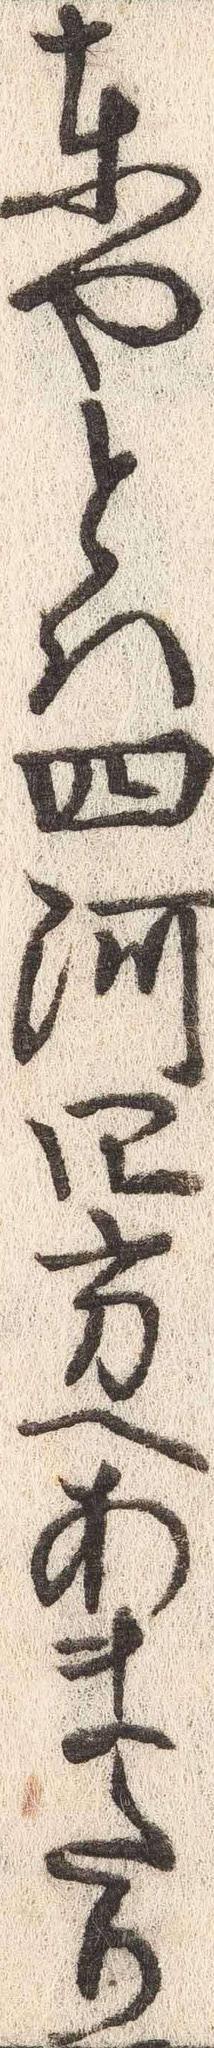東やとは四阿四方へあまたり
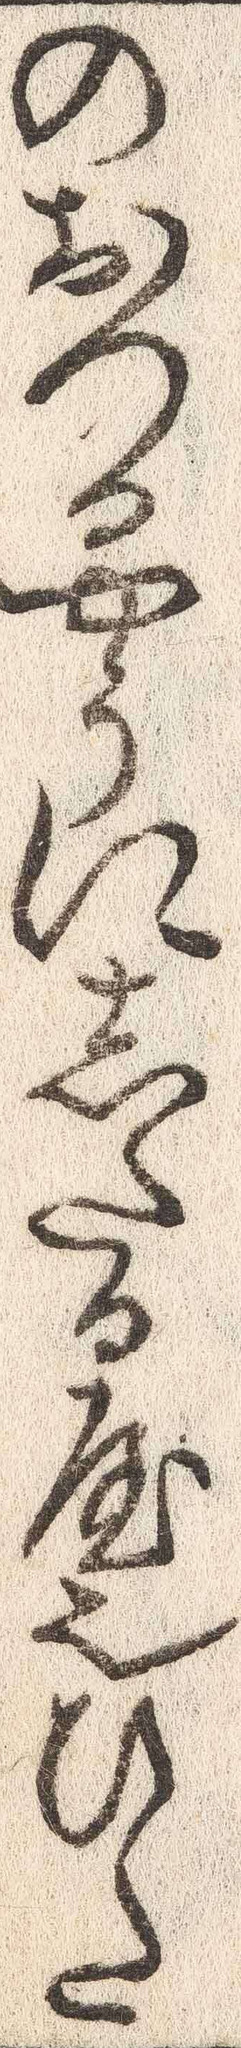のおつるやうにしたる屋也ひた
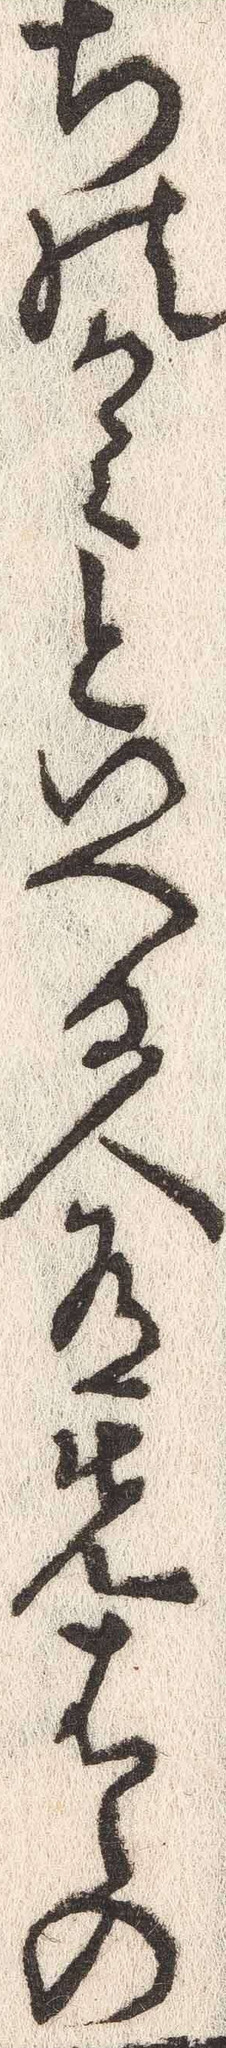ちのかみといへる人有先はゝの
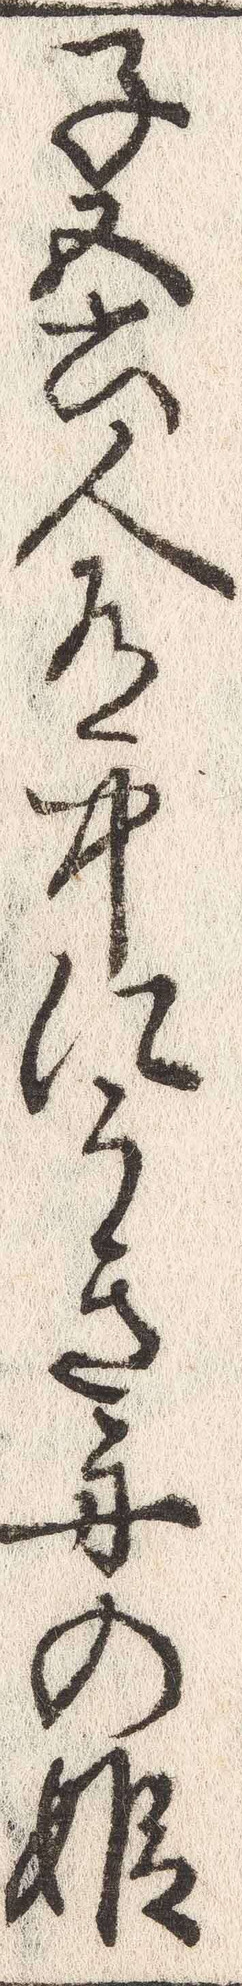子五六人有中にうき舟の姫
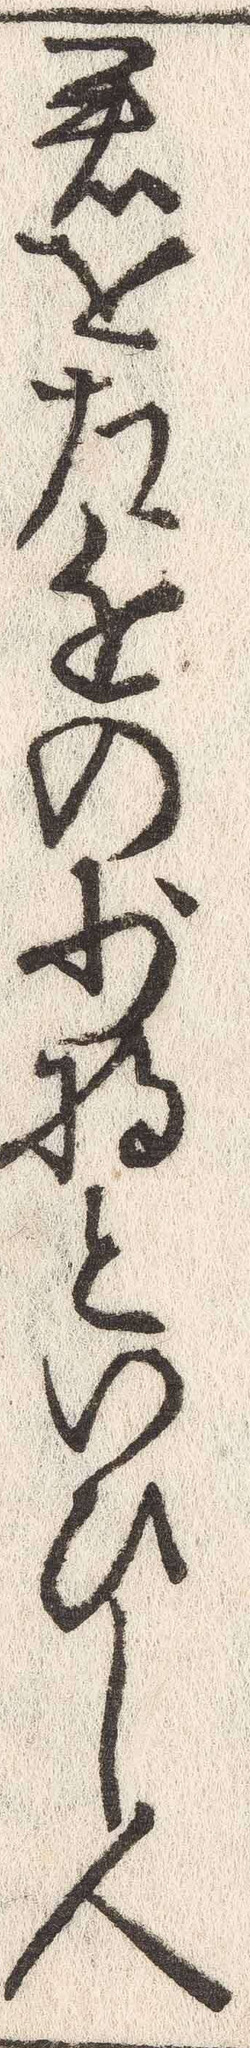君を左近の少将といひし人
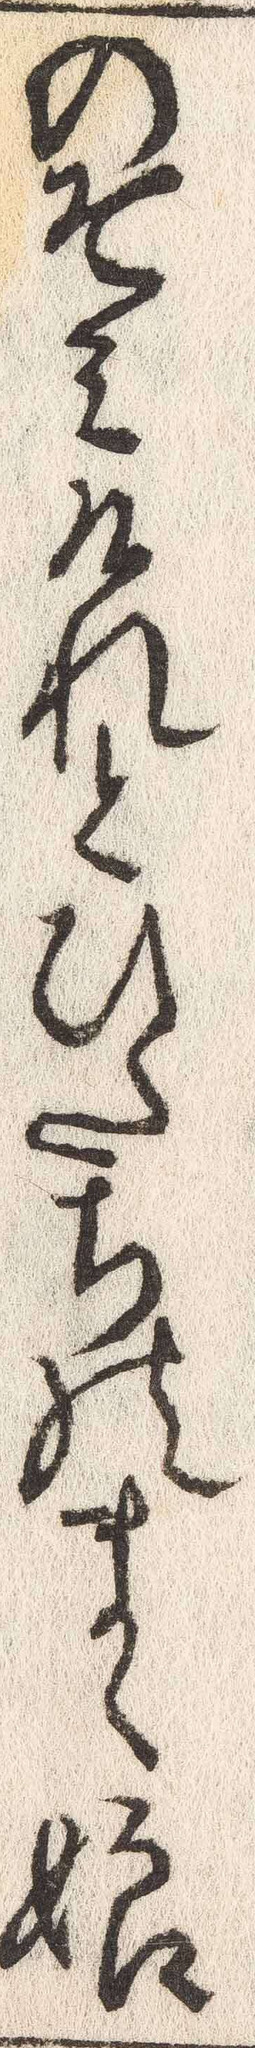のそみけれとひたちのまゝ娘
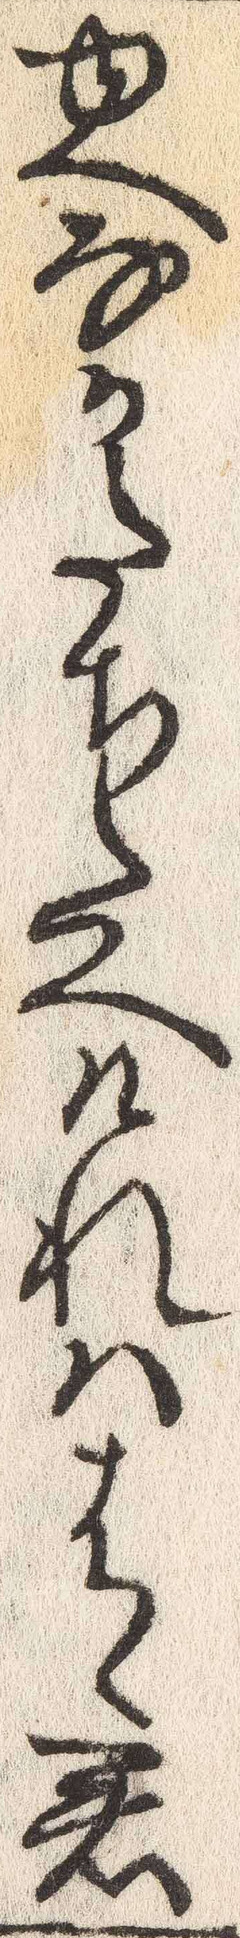ゆへなかたちたへけれははゝ君

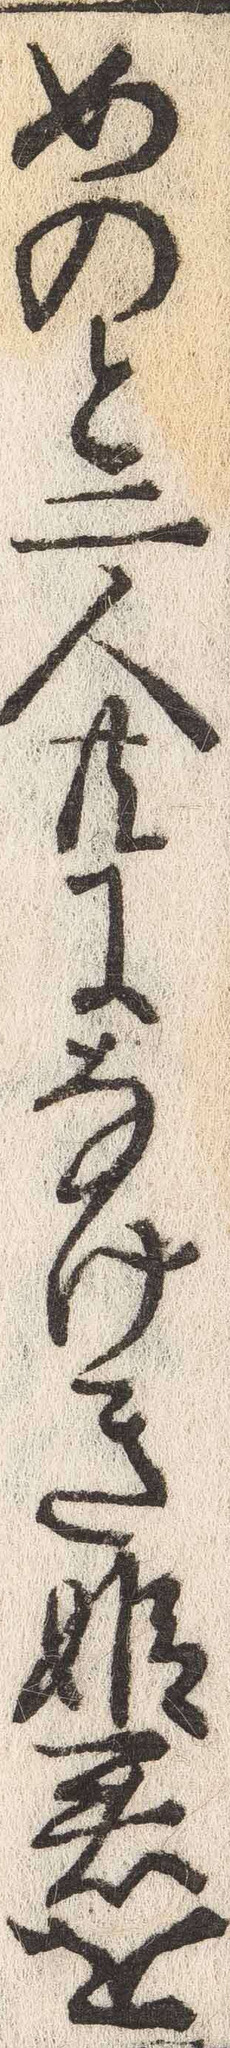めのと二人共になけき姫君を
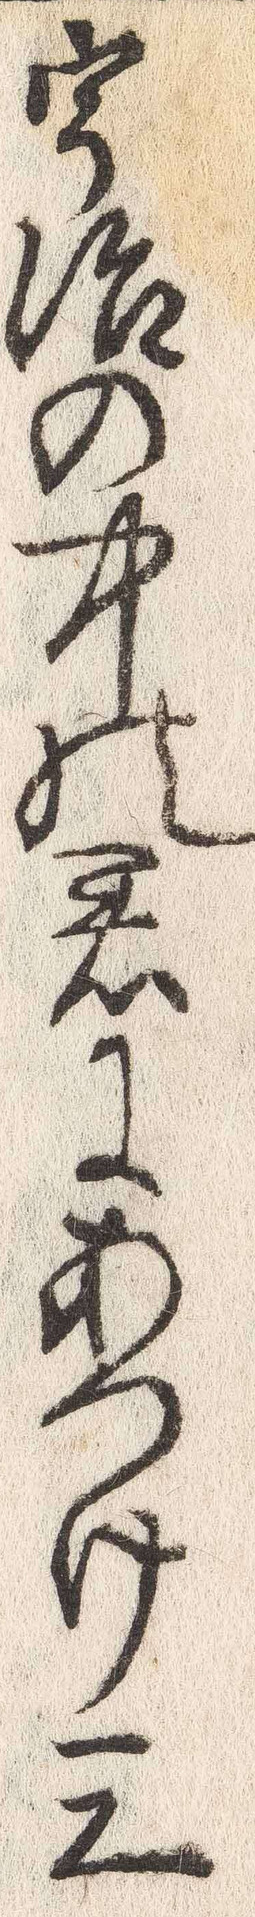宇治の中の君にあつけ三
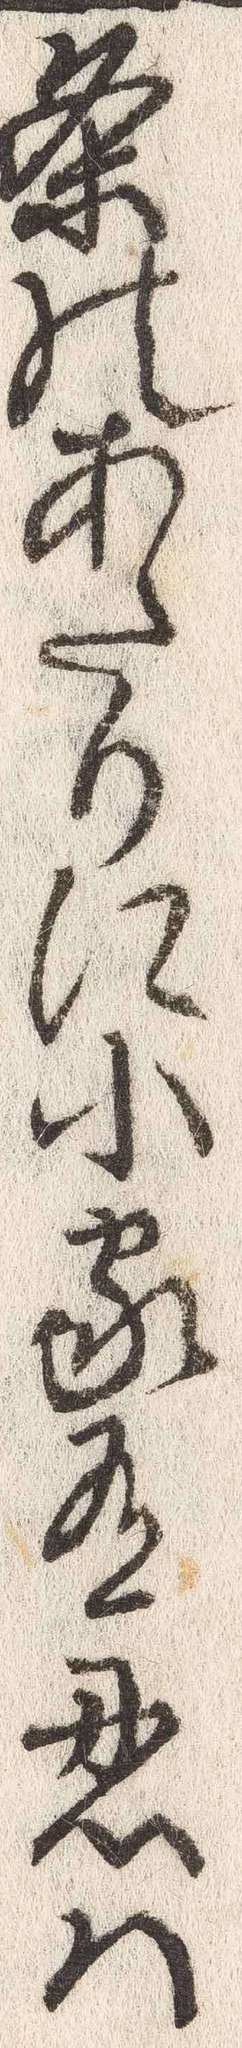条のあたりに小家有忍は
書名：源氏物語
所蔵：東京学芸大学附属図書館 国文学研究資料館
